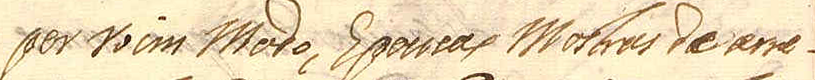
por roim Modo, E poucas mostras de arre
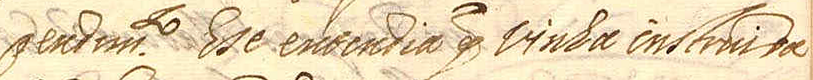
pendim.to E se entendia q̄ Vinha instruida
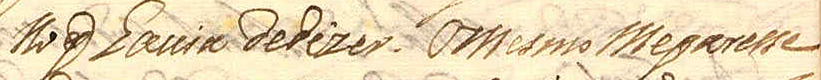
No q̄ hauia de dizer. O mesmo me paresse
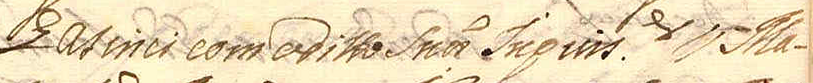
E asinei com o ditto snōr Inquis.or //Ma
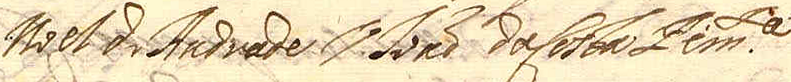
noel de Andrade //Ioão da Costa Pim.ta
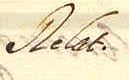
Relat.
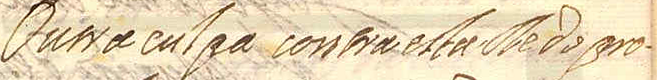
Outra culpa contra esta Re do pro
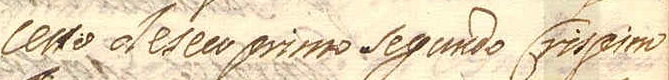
cesso de seu primo segundo Crispim
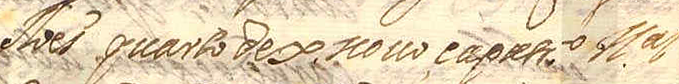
Roes̄ quarto de x. novo çapatr.o N.al
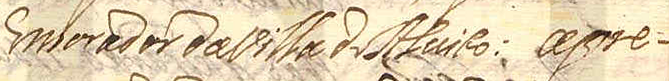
E morador da Villa d'Aluito: apre
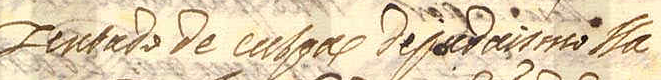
zentado de culpas de judaismo Na
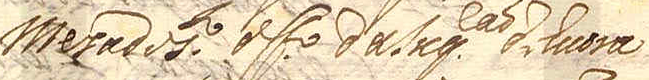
meza do s.to off.o da Inq.cão de Euora
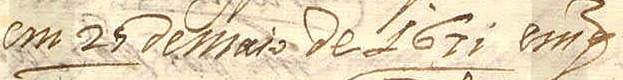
em 29 de maio de i67i em q̄
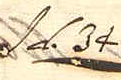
Id. 34
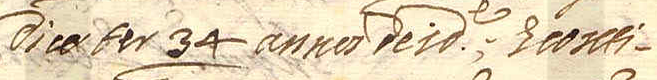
dice ter 34 annos de id.e; E conti
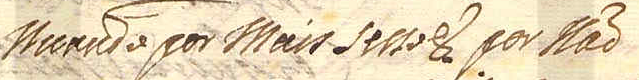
nuando por Mais sessoẽs por Não
